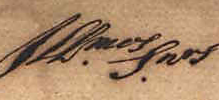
Jll.mos S.nrs
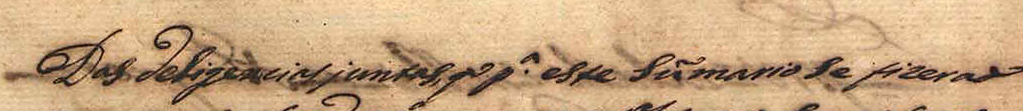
Das deligencias juntas q̄ p.a este sūmario se fizeraõ
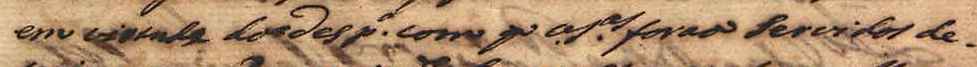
em virtude do desp.o como q̄ v. s.as foraõ servidos de
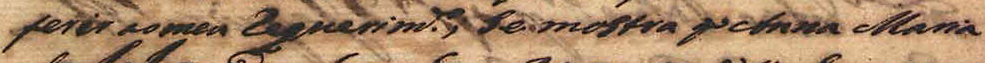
ferir ao meu Requerim.to, se mostra q̄ Anna Maria
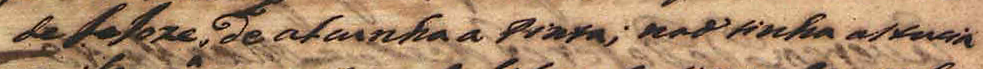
de Sa Ioze, de alcunha a Pinta; naõ tinha astucia
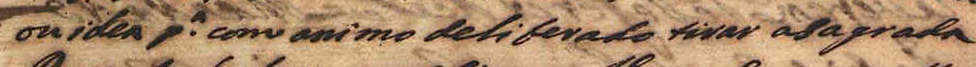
ou idea p.a com animo deliberado tirar a sagrada
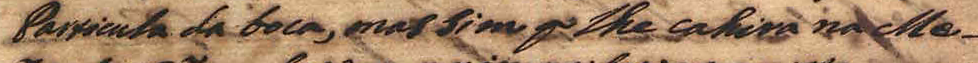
Particula da boca, mas sim q̄ lhe cahira na Me
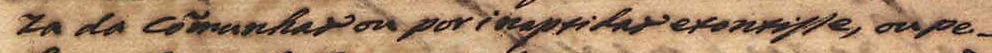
za da cōmunhaõ ou por inaptidaõ e tontisse, ou pe
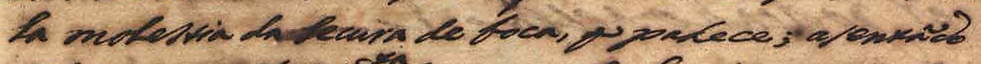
la molestia da secura de boca, q̄ padece; asentādo
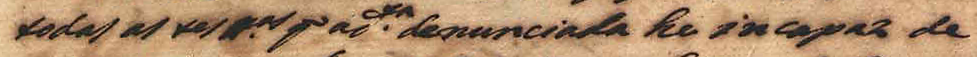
todas as test.as q̄ a d.ta denunciada he incapaz de
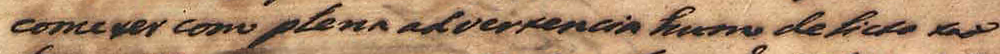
cometer com plena advertencia hum delicto taõ
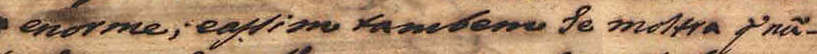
enorme; e assim tambem se mostra q̄ nū
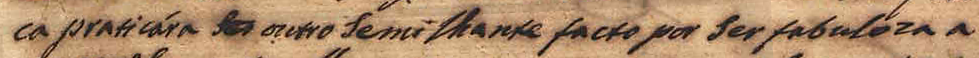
ca praticára _ outro semilhante facto por ser fabuloza a
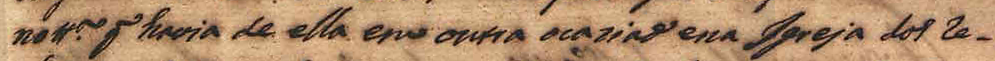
nott.a q̄ havia de ella em outra ocaziaõ e na Igreja dos Re
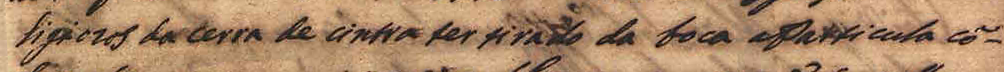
ligiozos da cerra de cintra ter tirado da boca a Particula cō
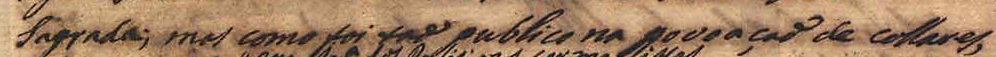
Sagrada; mas como foi taõ publico na povoaçaõ de collares,
